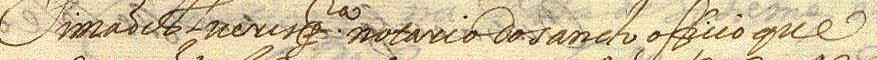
Simaõ Alueres p.ra notario do sancto offiçio que
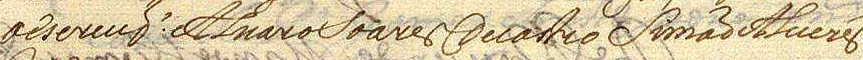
o escreuj? Aluaro Soares de castro Simaõ Alueres
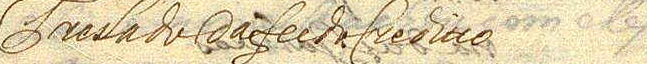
Treslado da fee do Creditto
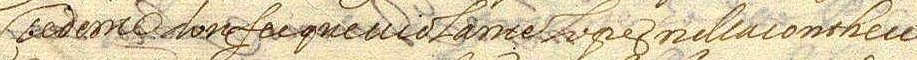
cedente dou fee que uiolante lopes nella contheu
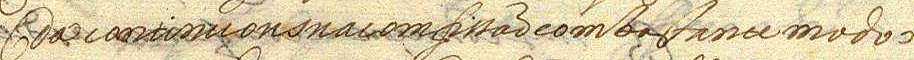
da continuou sua comfissaõ com bastante modo
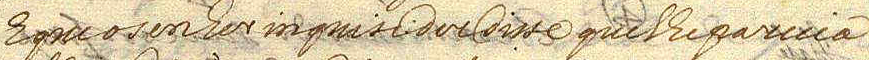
E que o senhor inquisidor disse que lhe parecia
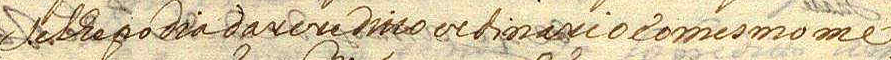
se lhe podia dar creditto ordinario e o mesmo me
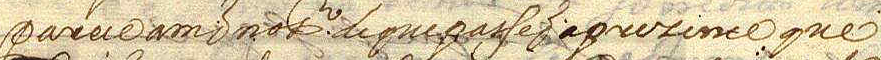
pareçe a mj̄ not.ro de que passej a prezente que
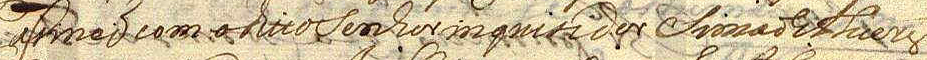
assinaõ com o ditto Senhor inquisidor Simaõ Alueres
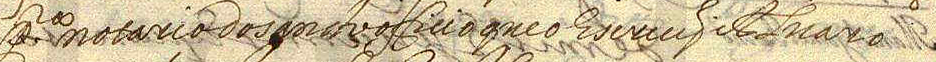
p.ra notario do sancto officio que o Escreuj Aluaro
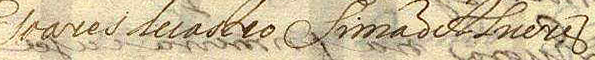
Soares de castro Simaõ Alueres
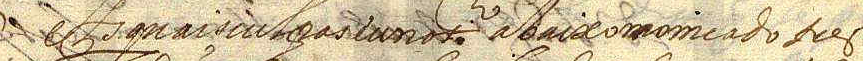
As quais culpas eu not.ro abaixo nomeado tres
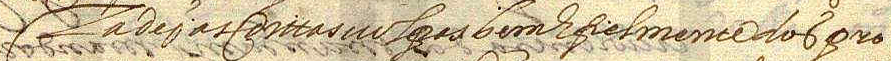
Ladej as dittas culpas bem E fielmente dos pro
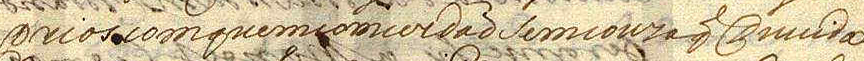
prios com quem comcordaõ sem couza q̄ duuida
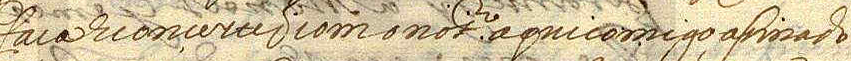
faça E conçertej com o not.ro aqui comigo assinado
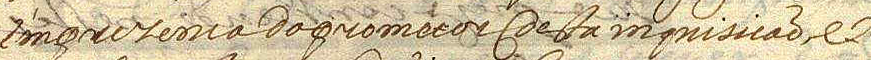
em prezenca do prometor desta inquisicaõ, &
